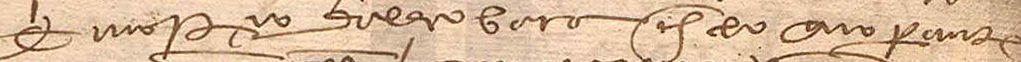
E mostro dallcobaca c̄ꝭ loguo ꝑante
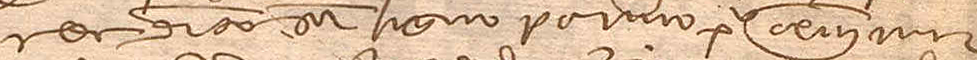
elle dito s̄or vigro pareçeo po āluz mer
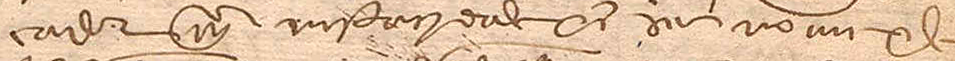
cador mor nesta cjdade e ē seu nome e de
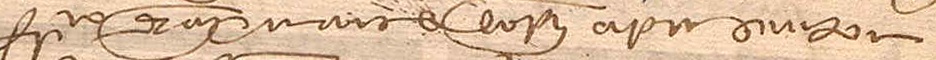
frco diaz e manoell lop̄z apresemtou
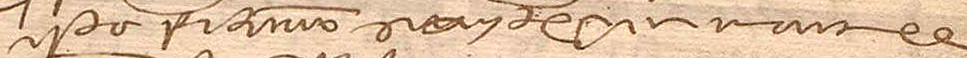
esta piticão segujte e eu manoell
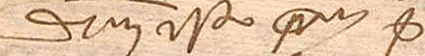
diaz esto sp̄uy
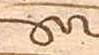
S̄or
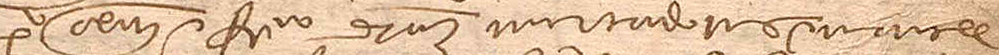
ꝑo āluz e frco diaz mercadores e manoell
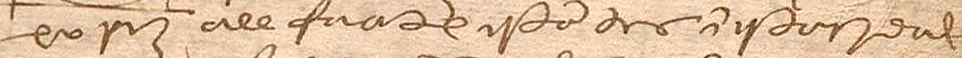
lopez allfaate estātes ē esta cjdade
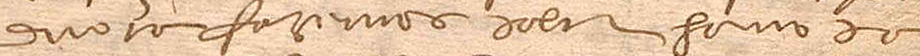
deuora fazemos saber ha uosa
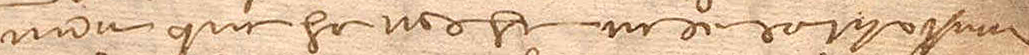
mēçe que ha nos he necesaryo ꝓuar
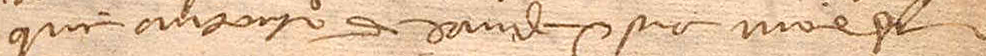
que antonjo de sande e sua molher
